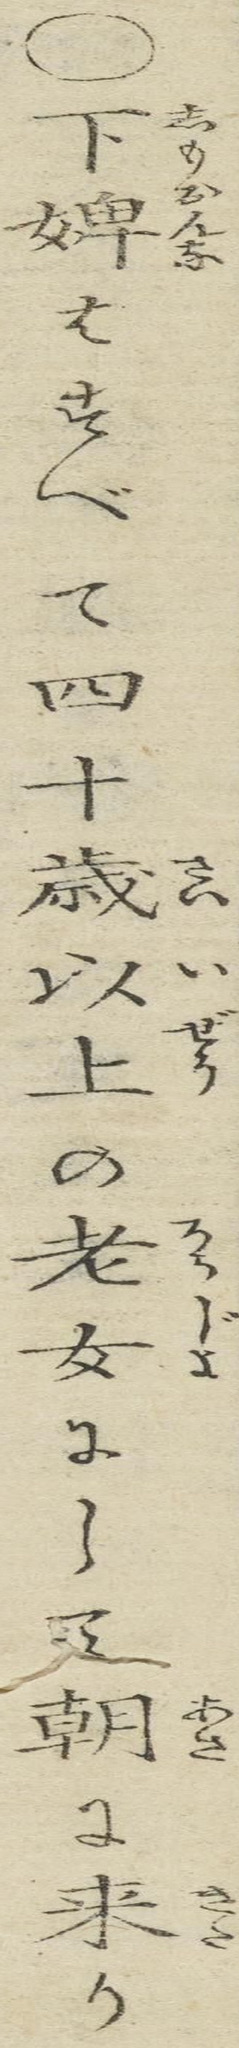○下婢はすべて四十歳以上の老女にして朝に来り
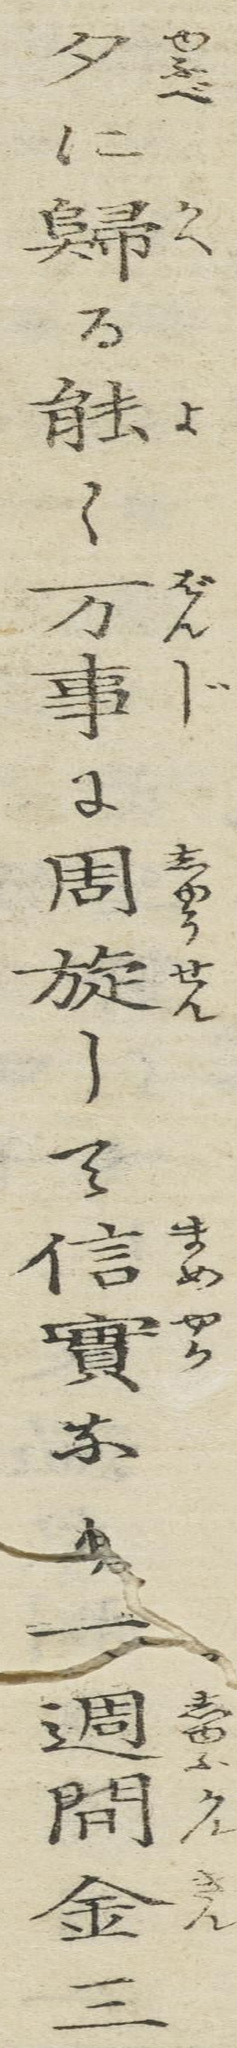夕に帰る能く万事に周旋して信実なり一週間金三
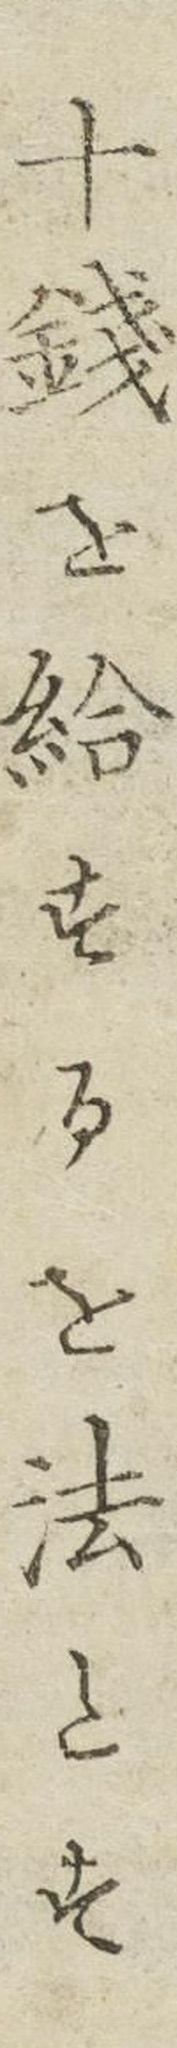十銭を給するを法とす
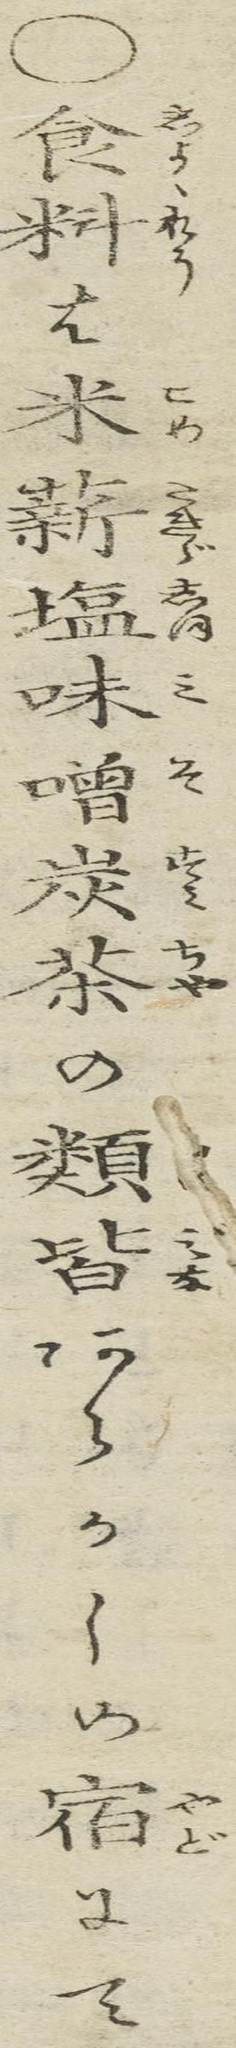○食料は米薪塩味噌炭茶の類皆なからしめ宿にて
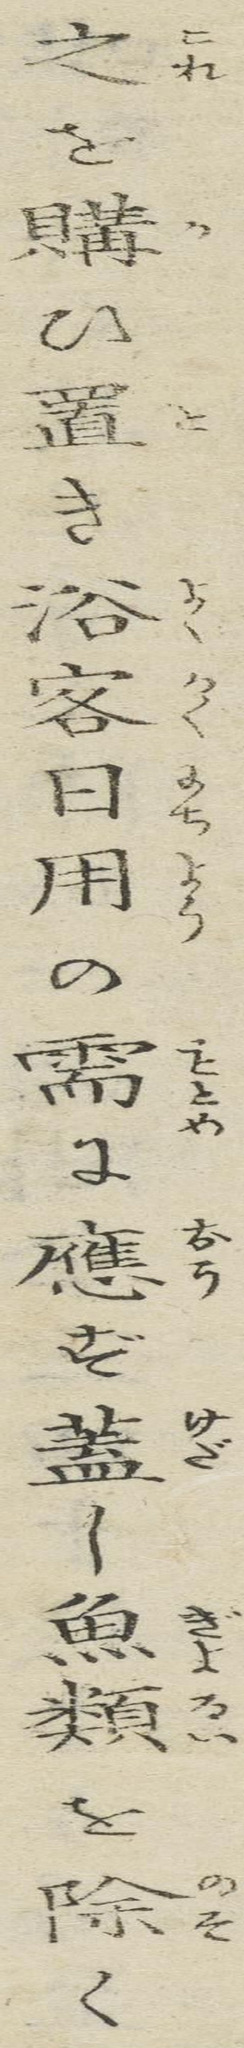之を購ひ置き浴客日用の需に応じ蓋し魚類を除く
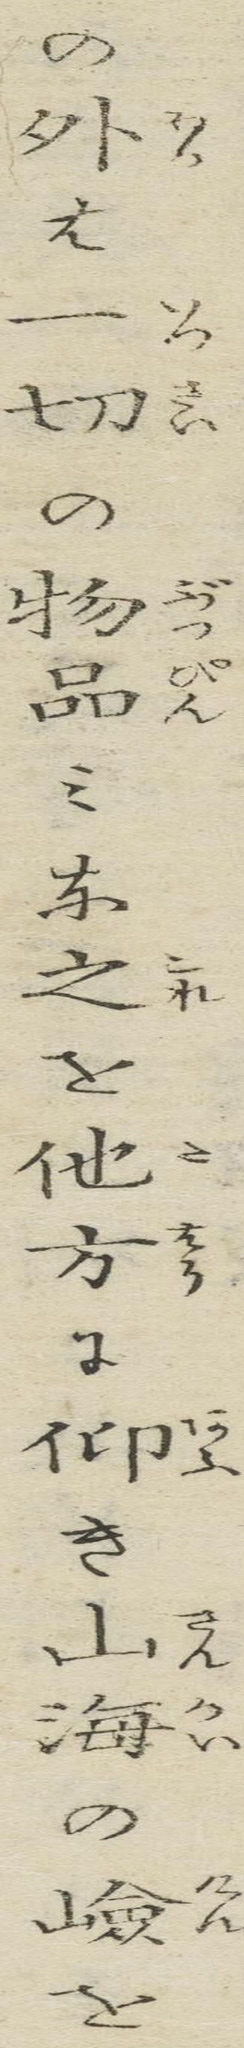の外は一切の物品みな之を他方に仰き山海の嶮を
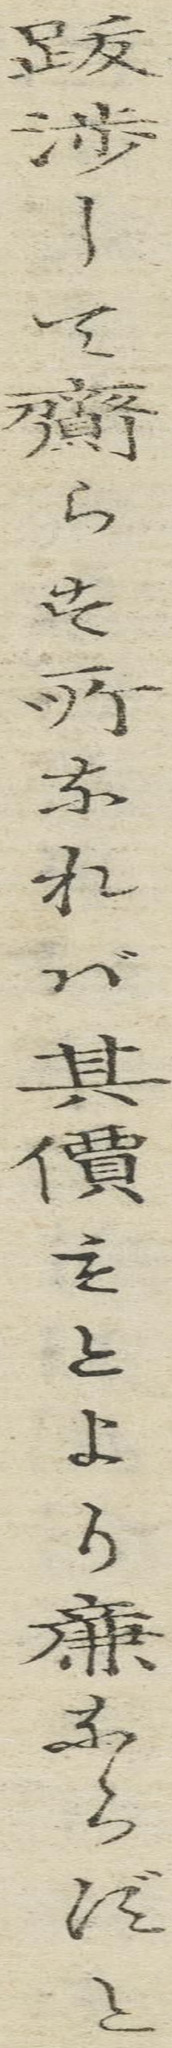跋渉して齎らす所なれば其価もとより廉ならずと
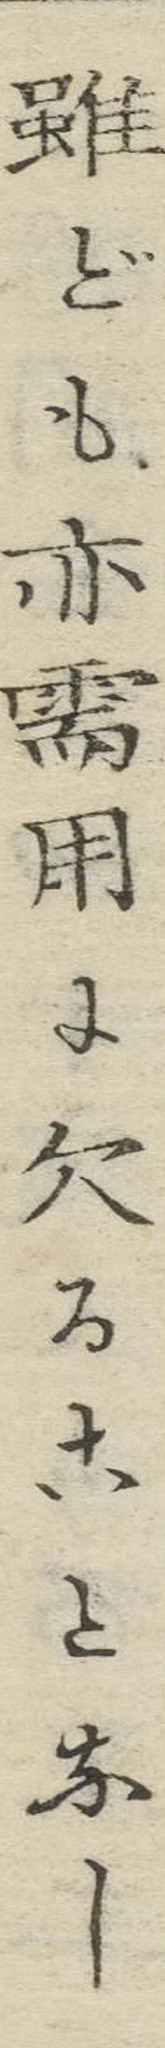雖ども亦需用に欠ることなし
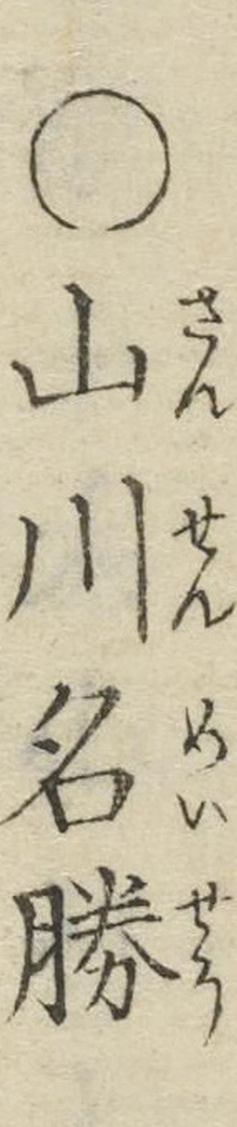○山川名勝
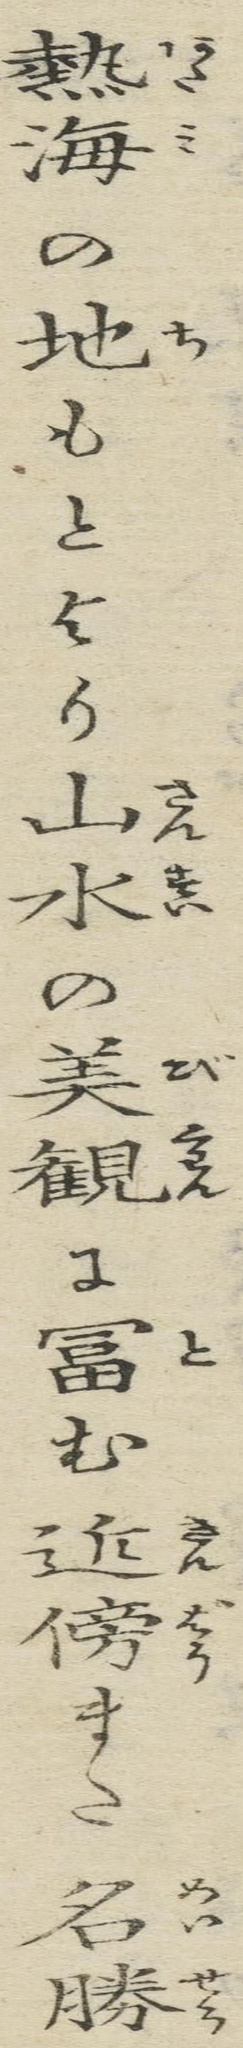熱海の地もとより山水の美観に富む近傍また名勝
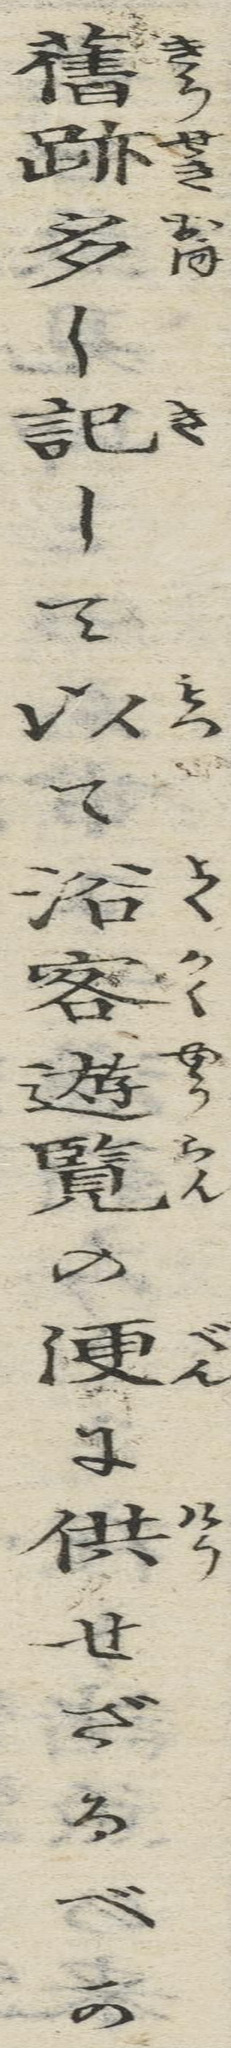旧跡多し記して以て浴客遊覧の便に供せざるべか
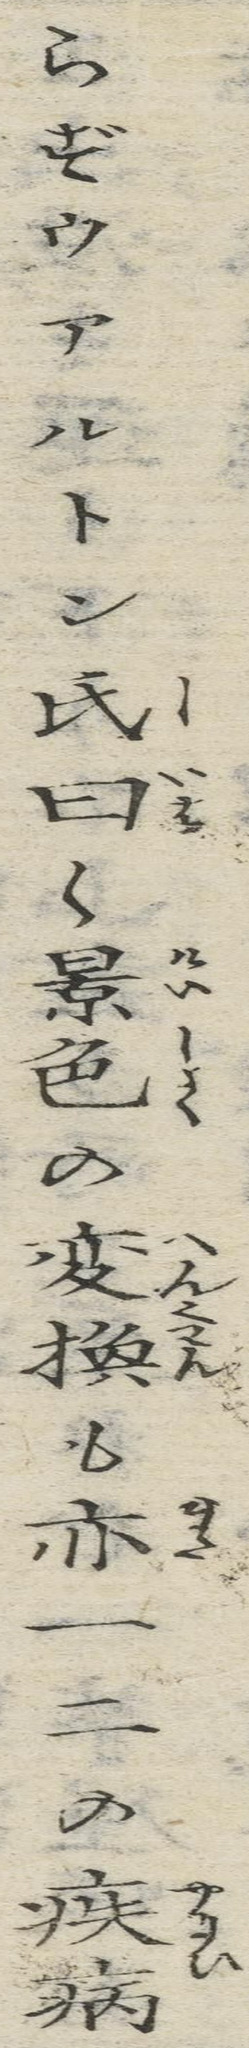らずウアルトン氏曰く景色の変換も亦一二の疾病
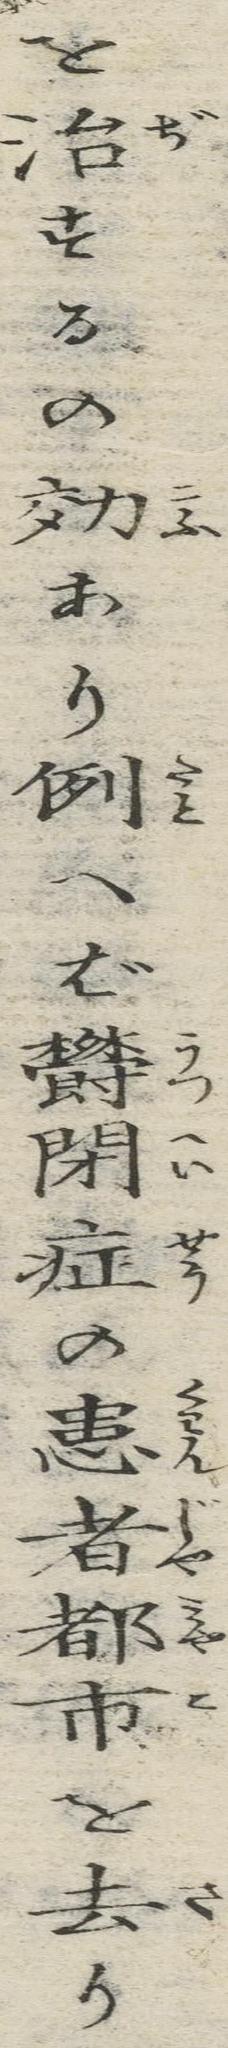を治するの効あり例へば欝閉症の患者都市を去り
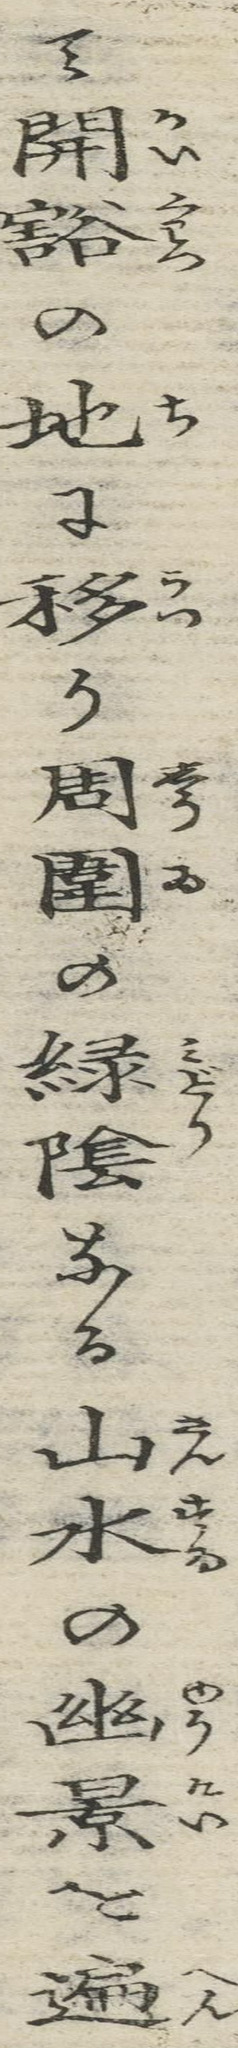て開豁の地に移り周囲の緑陰なる山水の幽景を遍
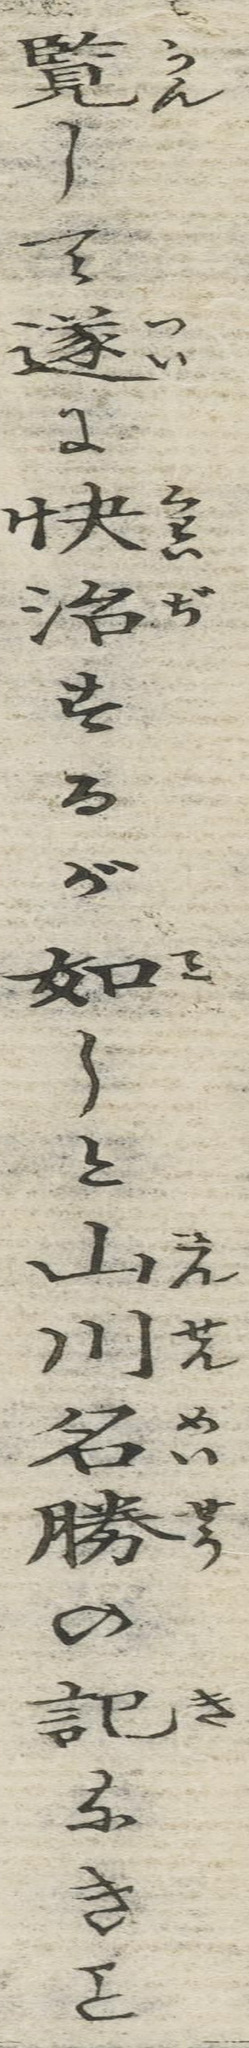覧して遂に快治するが如しと山川名勝の記なきを
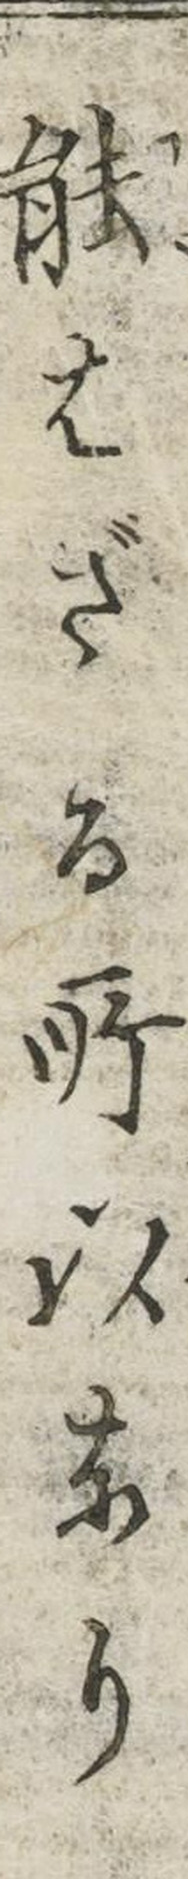能はざる所以なり
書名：豆州熱海誌　完
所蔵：東京大学地震研究所図書室 Earthquake Research Institute Library, The University of Tokyo, JAPAN
